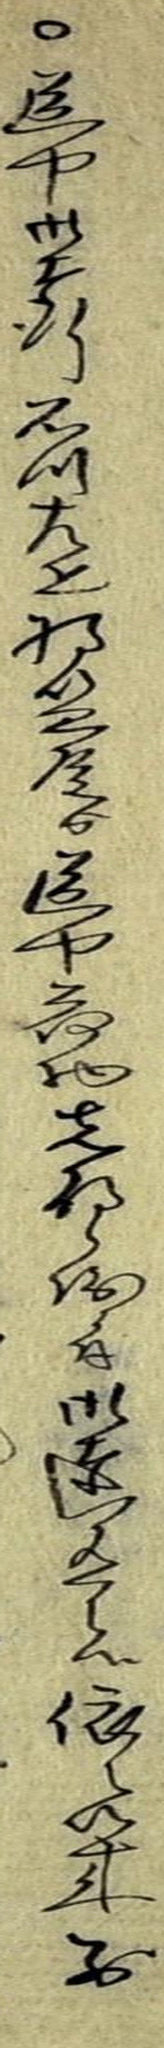○道中御奉行石川左近将監殿ゟ道中荷物先触之儀に付御達有之候依之以来別
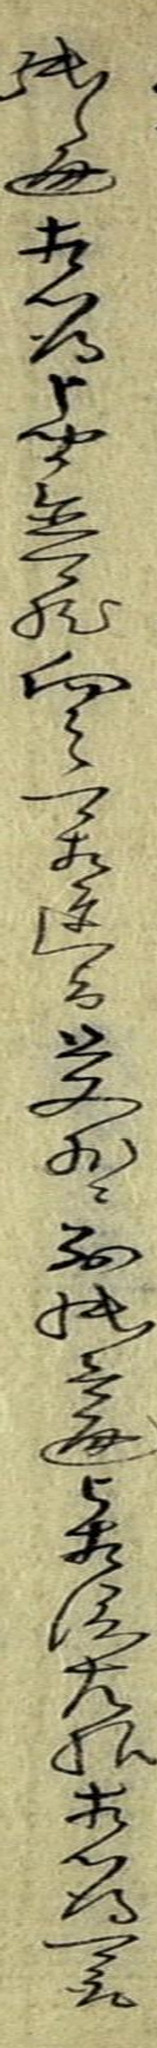紙之通相心得申聞置可然向々に可相達旨且又外に別紙壱通被相渡左様相心得可取
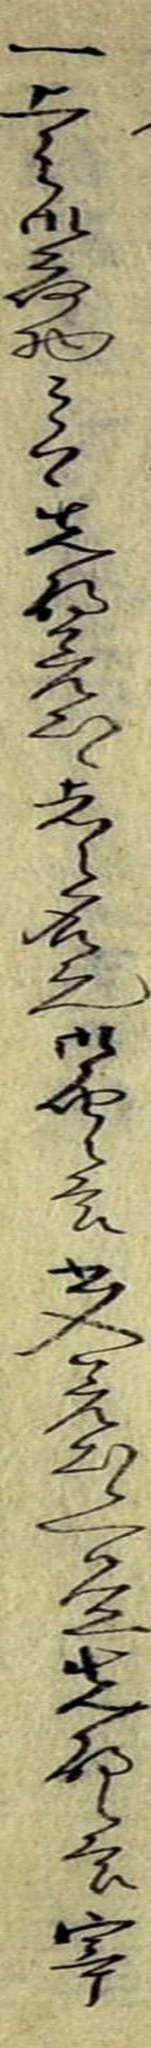一上之御荷物に候はヽ先触差出候者之名元御届之節書入差出候へは宜先触之節宰
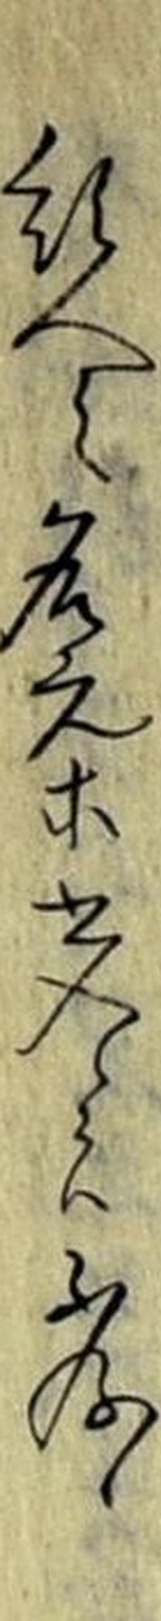領人之名元等書入候には不及候
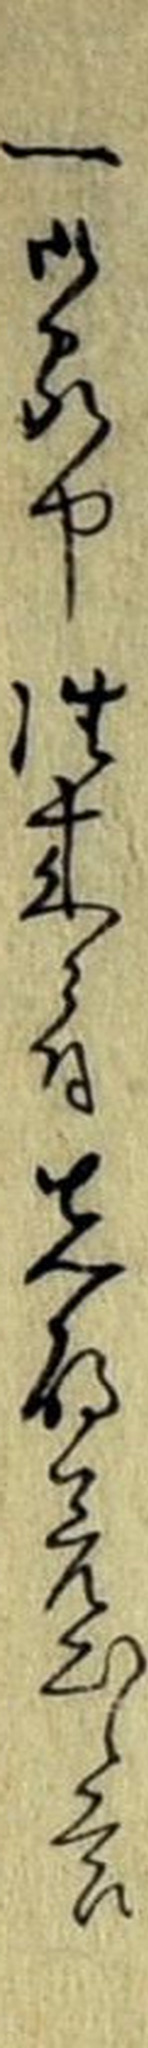一御家中往来に付先触差出候節

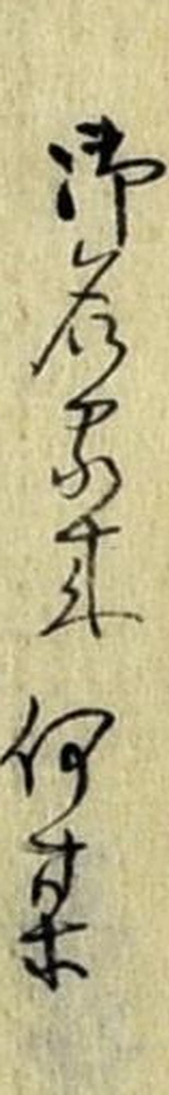御名家来何某
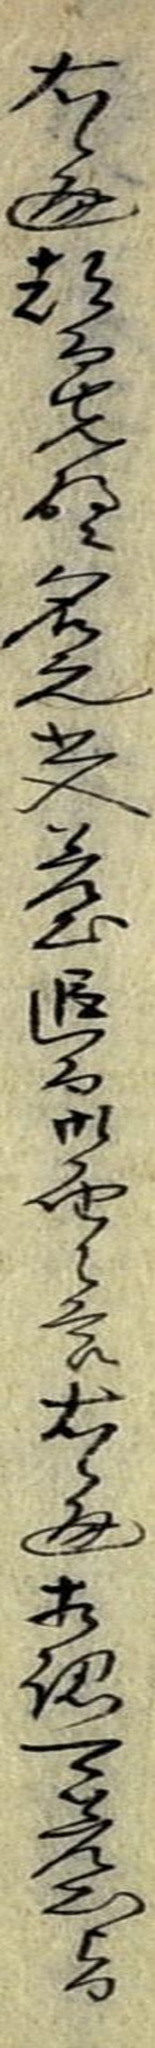右之通都而先触に名元書入差出追而御届之節右之通相認可差出旨
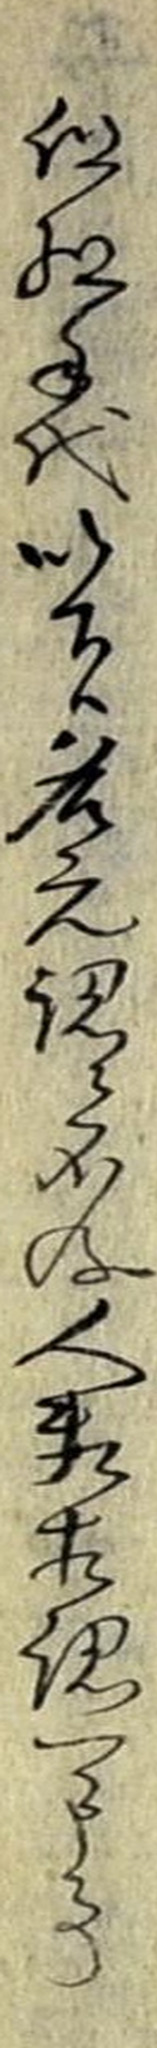但組手代以下は名元認に不及人数相認可申事
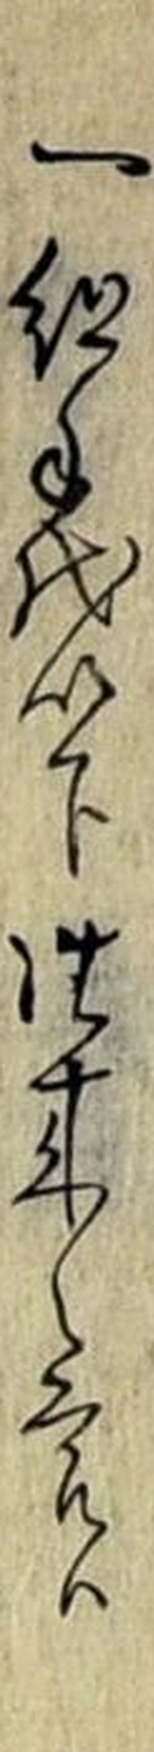一組手代以下往来之節は
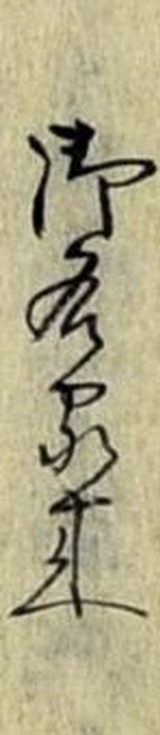御名家来
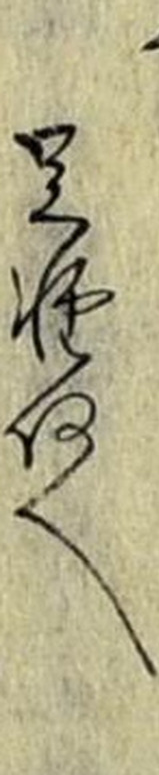足軽何人
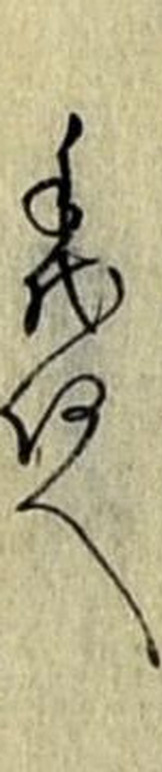手代何人
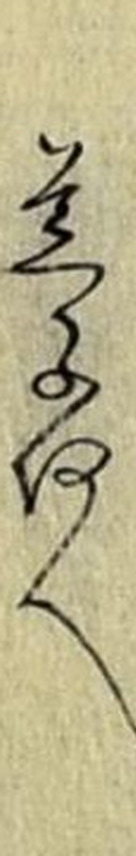荒子何人
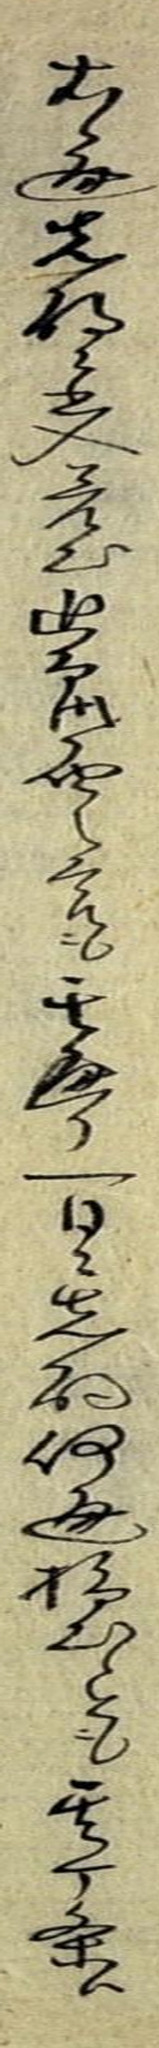右之通先触に書入差出追而御届之節も其通り一日に先触何通指出候とも其ヶ条は
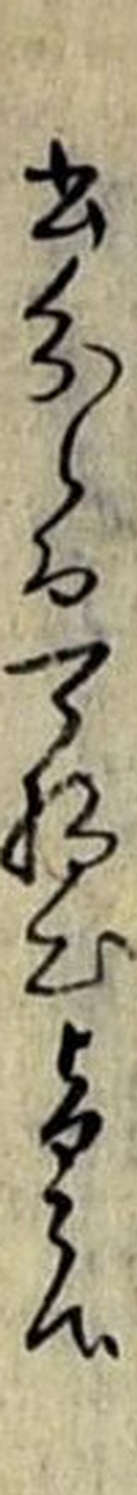書分に而可指出旨に候
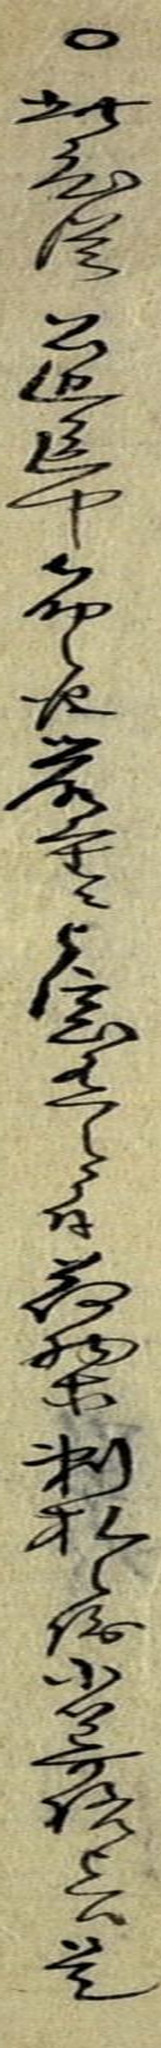○此度従公辺道中筋之儀厳重に被仰出有之候に付荷物等刺札之儀小算格迄は是
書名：命令之部 四
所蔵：福井県文書館 Fukui Prefectural Archives
